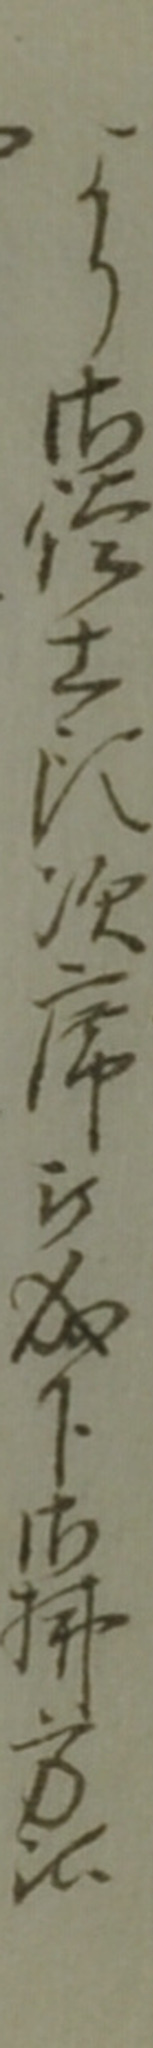より御徒士頭次席被成下御払方被

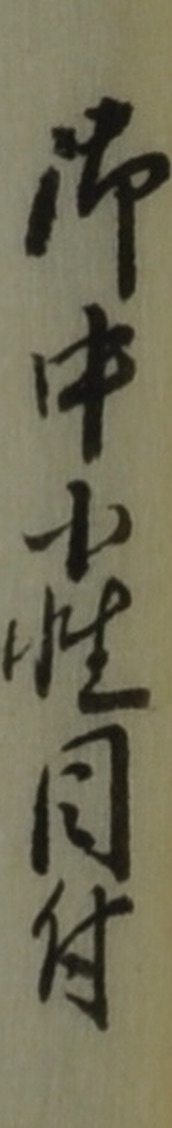御中小姓目付
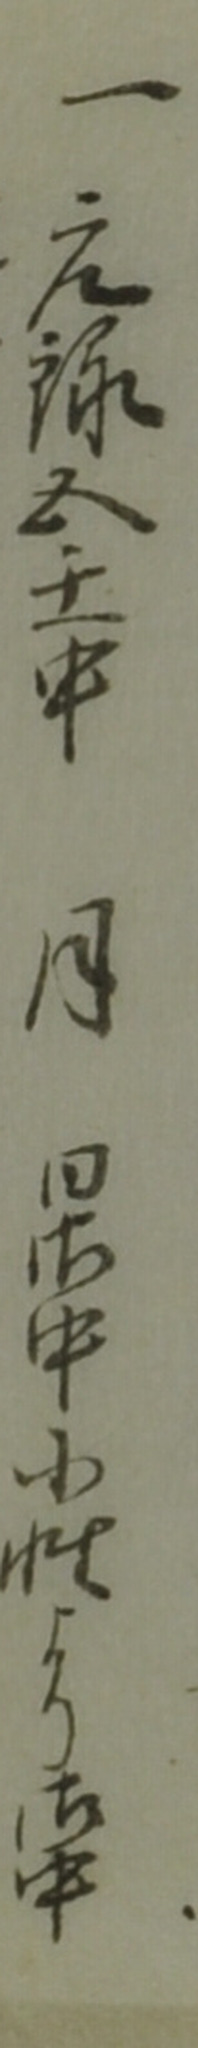一元禄五壬申月日御中小姓より御中
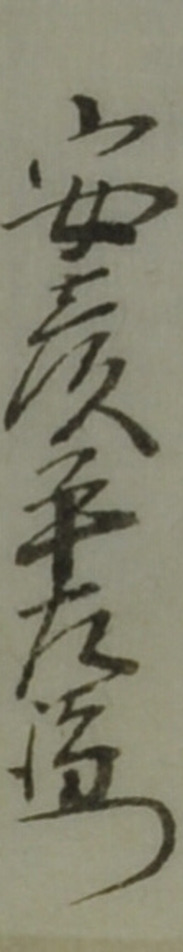安彦平左衛門
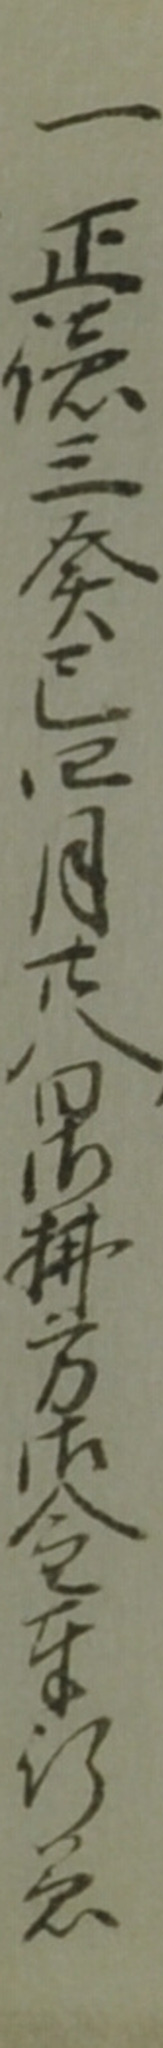一正徳三癸巳四月廿八日御払方御金奉行兼
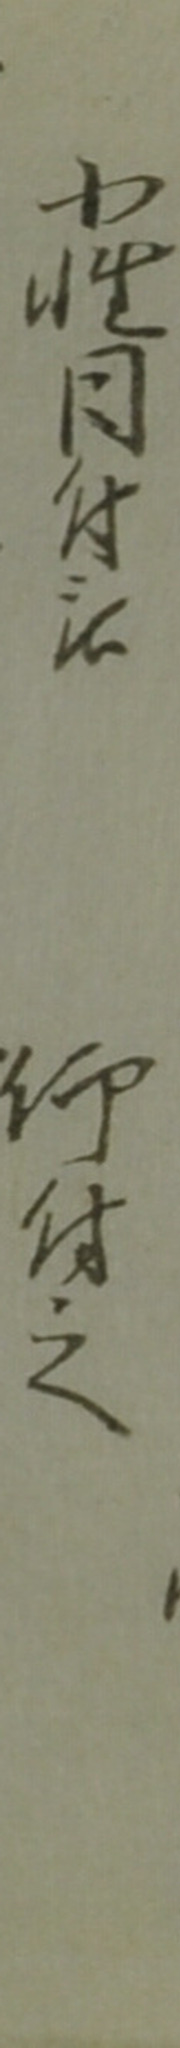小姓目付被仰付之
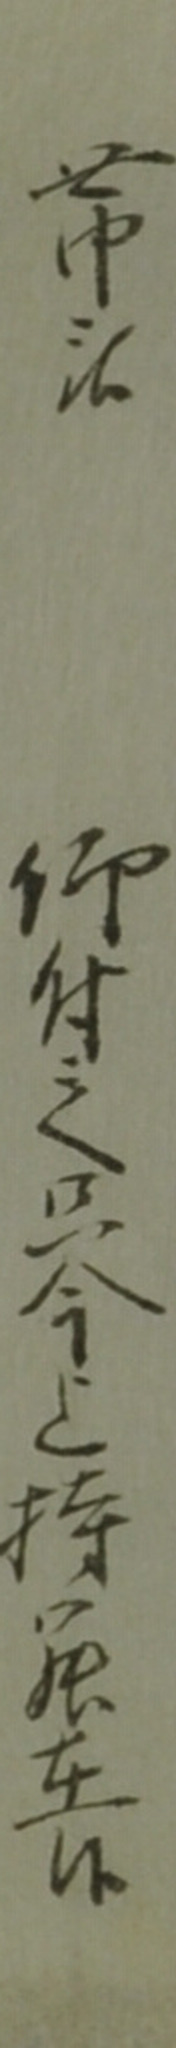帯被仰付之只今迄持罷在候
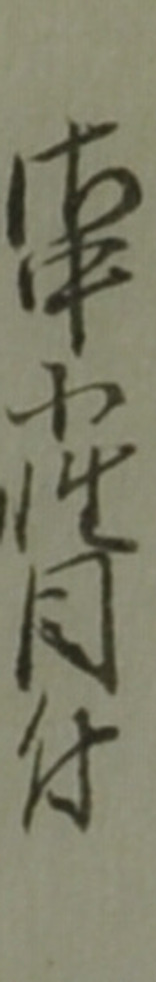御中小姓目付
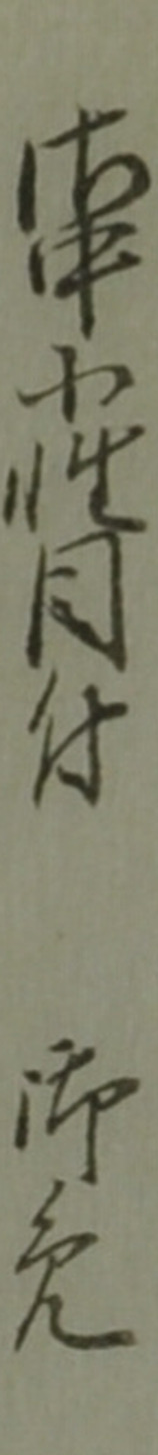御中小姓目付御免
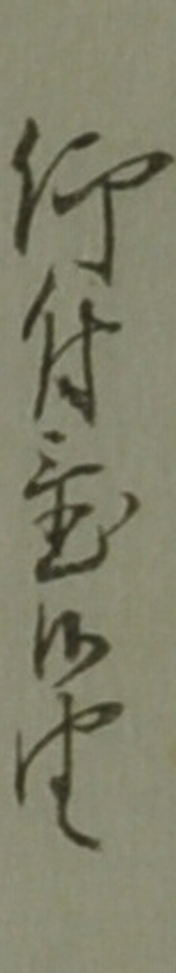仰付置候由
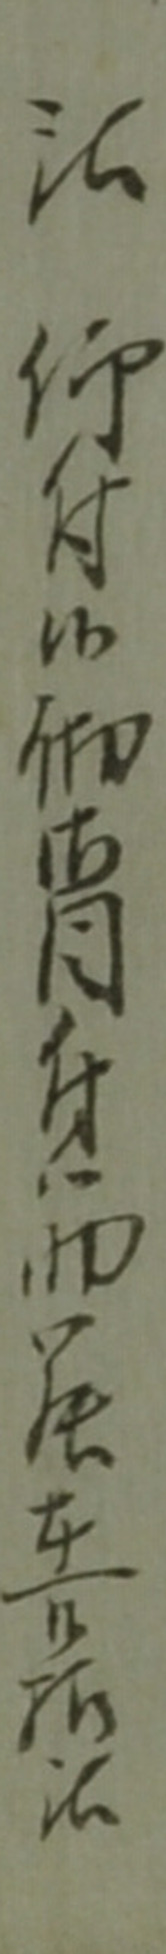被仰付候砌御目付筋罷在候様被
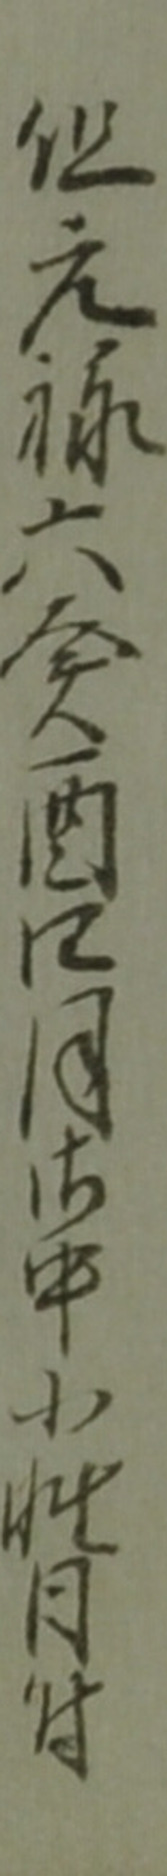但元禄六癸酉四月御中小姓目付
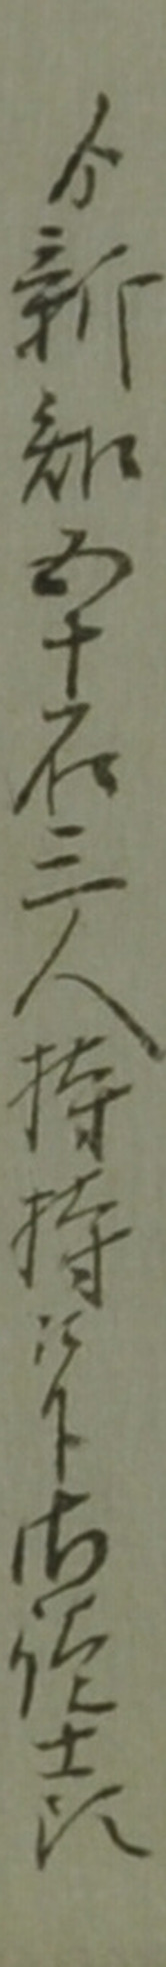より新知五十石三人持持被下御徒士頭
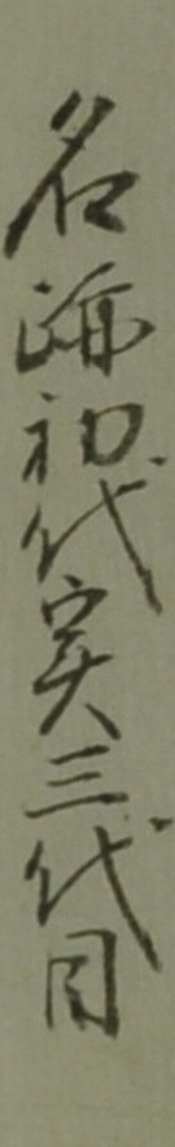名跡初代実三代目
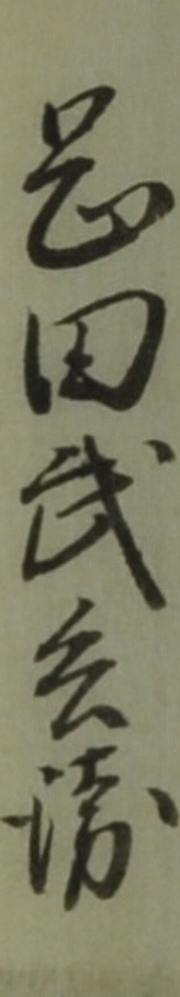岡田武兵衛

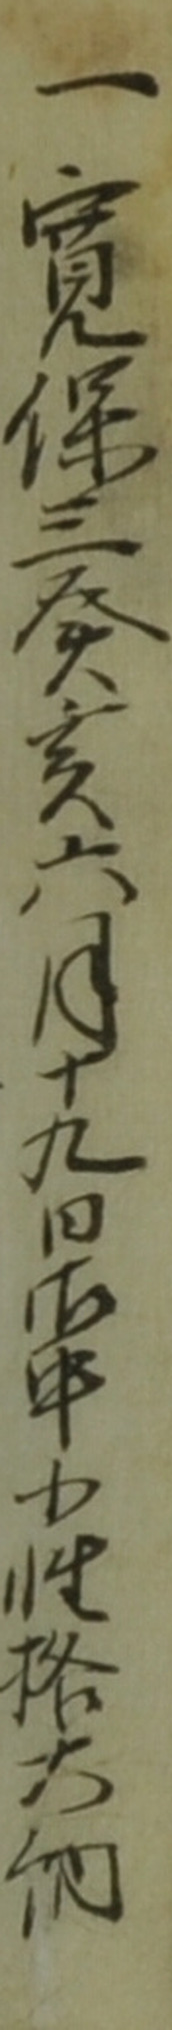一寛保三癸亥六月十九日御中小姓格大納
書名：諸御役代々録（八）
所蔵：伊那市立高遠町図書館・合同会社AMANE
